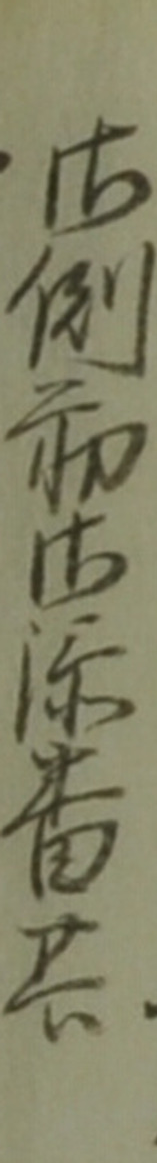御側勤御添番共
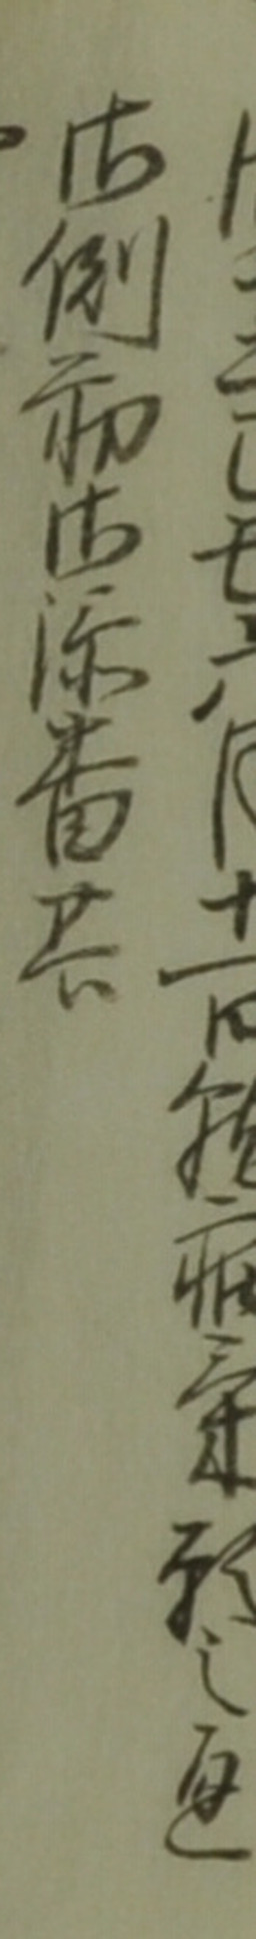御側勤御添番共
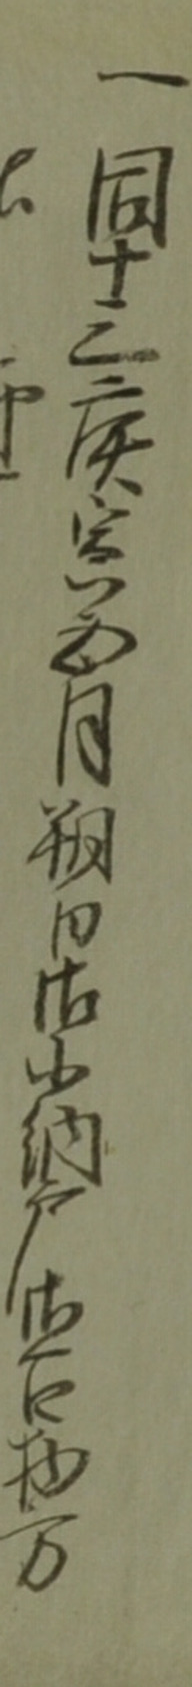一同十三庚寅五月朔日御小納戸御召物方
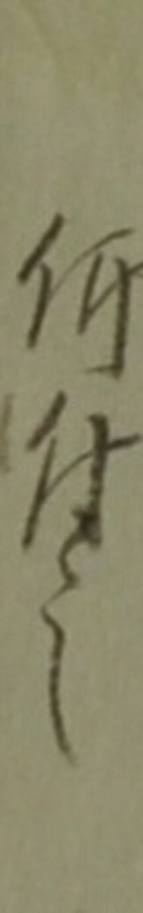仰付之
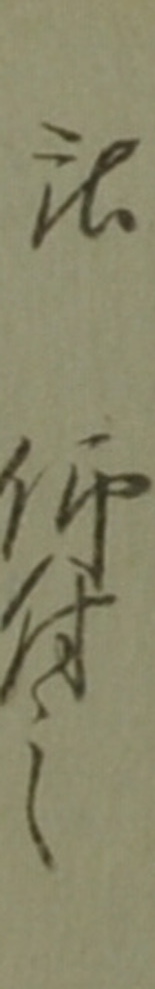被仰付之
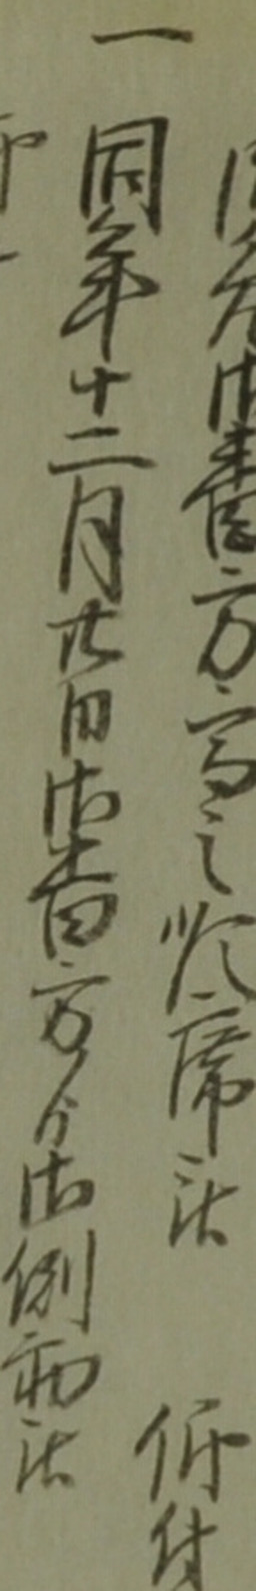一同年十二月廿日御番方ゟ御側勤被
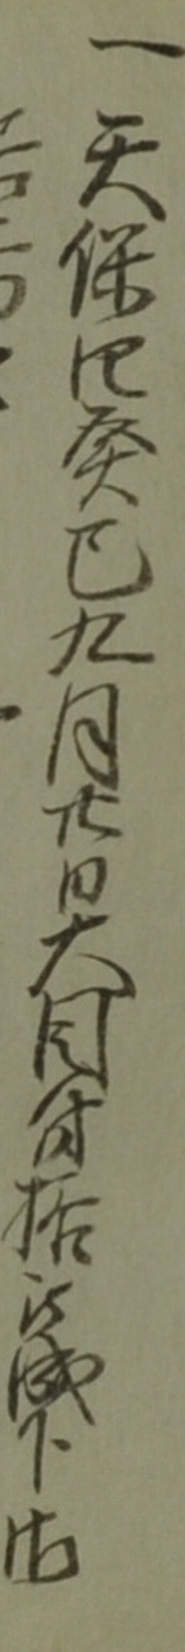一天保四癸巳九月廿日大目付格被成下御
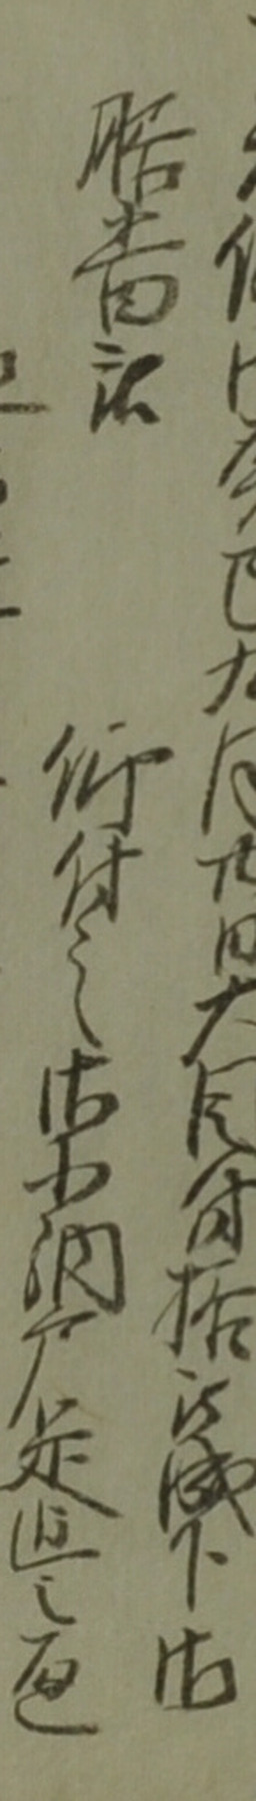膳番被仰付之御小納戸是迄之通
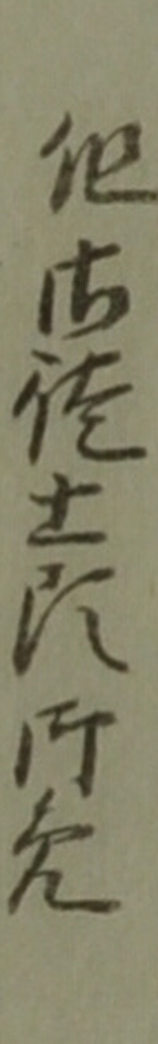但御徒士頭御免
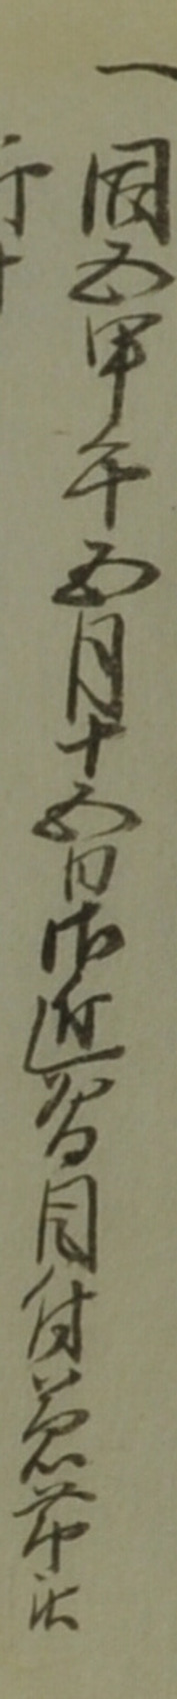一同五甲午五月十五日御近習目付兼帯被
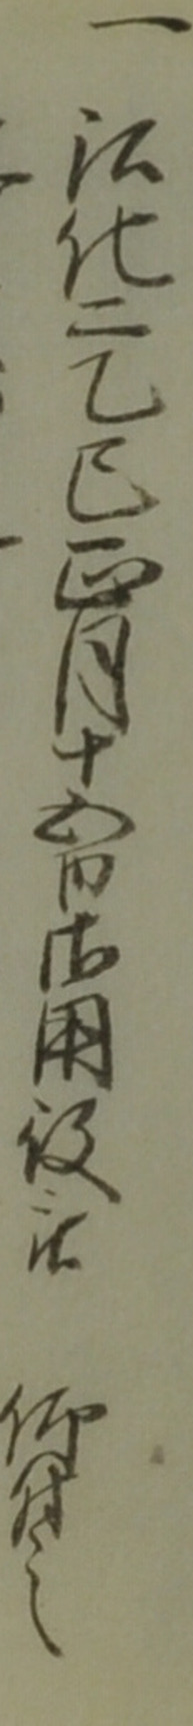一弘化二乙巳正月十五日御用役被仰付之
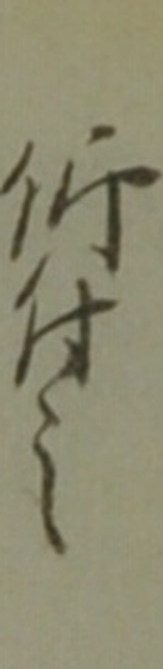仰付之
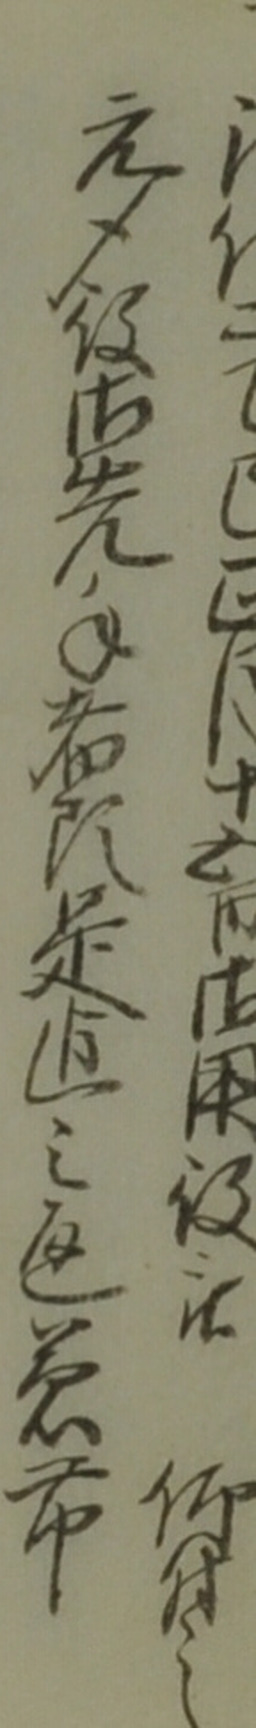元〆役御先手者頭是迄之通兼帯
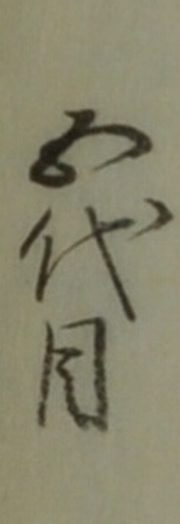五代目
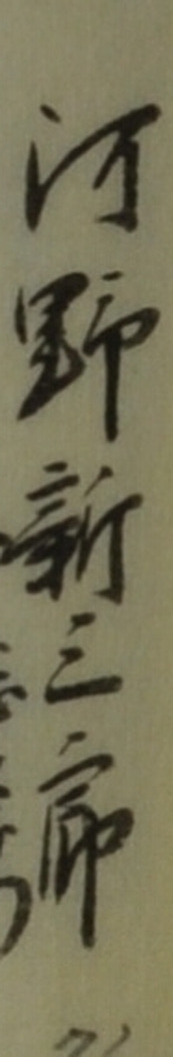河野新三郎
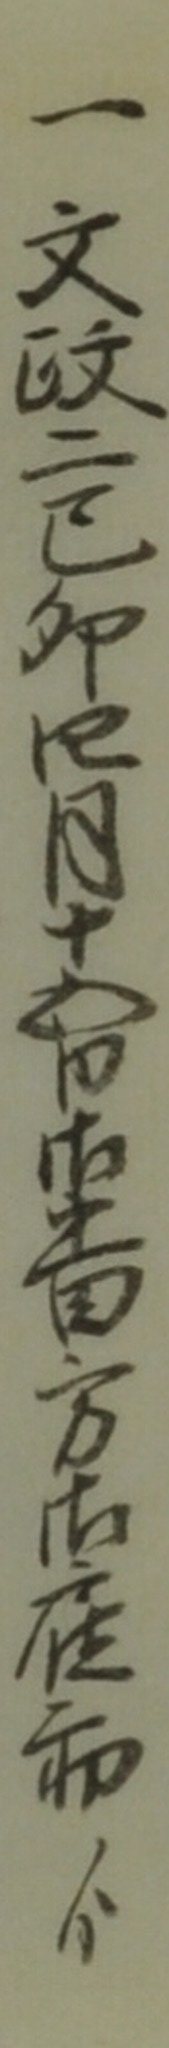一文政二己卯四月十五日御番方御雇ゟ
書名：諸御役代々録（五）
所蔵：伊那市立高遠町図書館・合同会社AMANE
